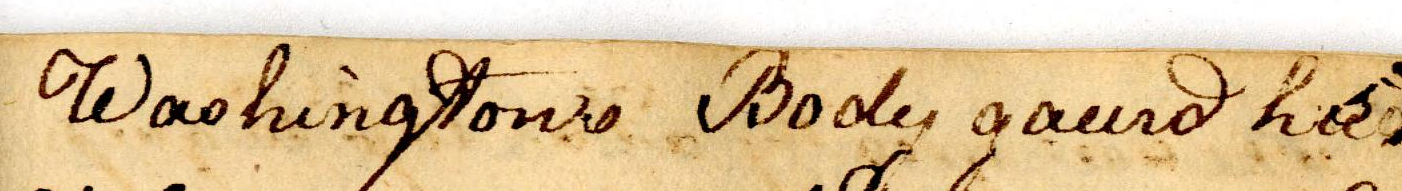Washingtons Body gaurd had
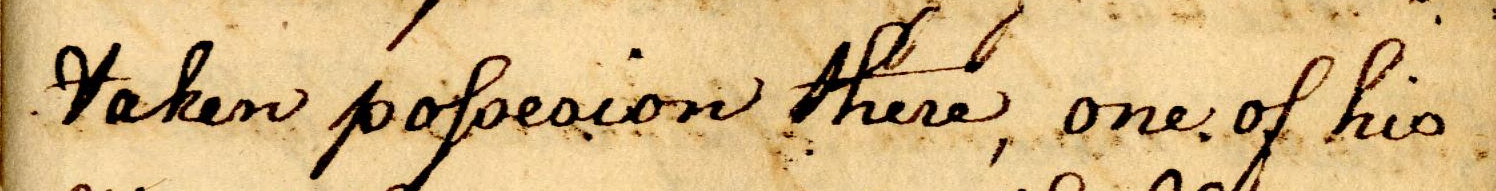taken possesion there, one of his
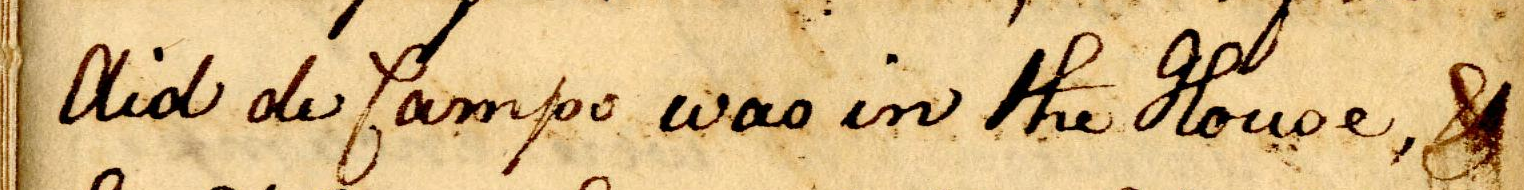Aid de Camps was in the House, &
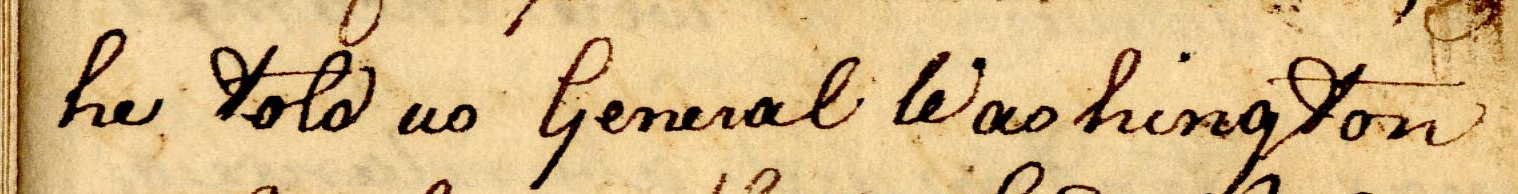he told us General Washington
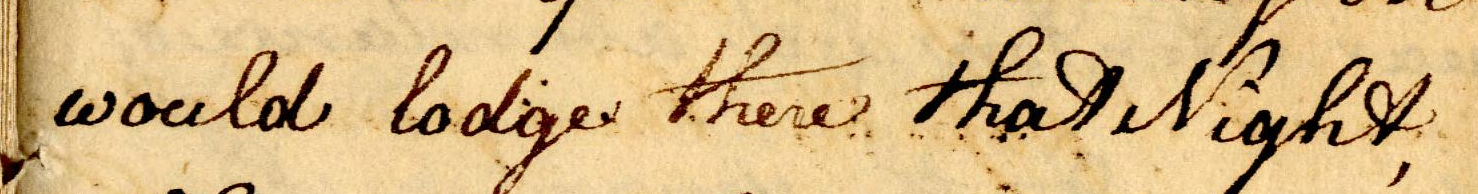would lodge there that Night,
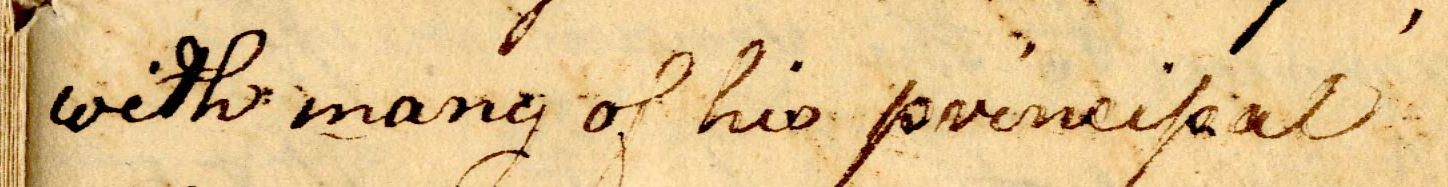with many of his principal
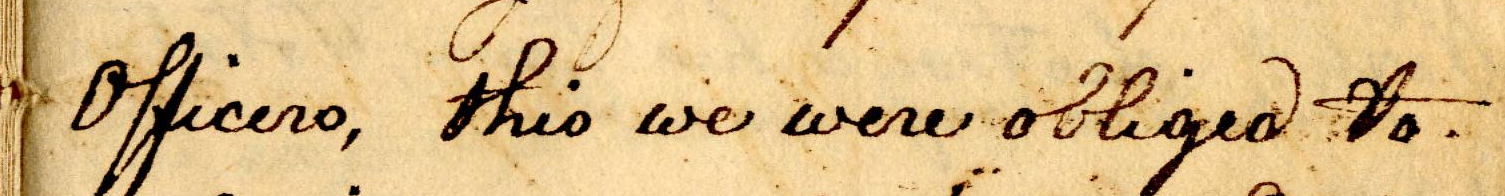Officers, this we were obliged to
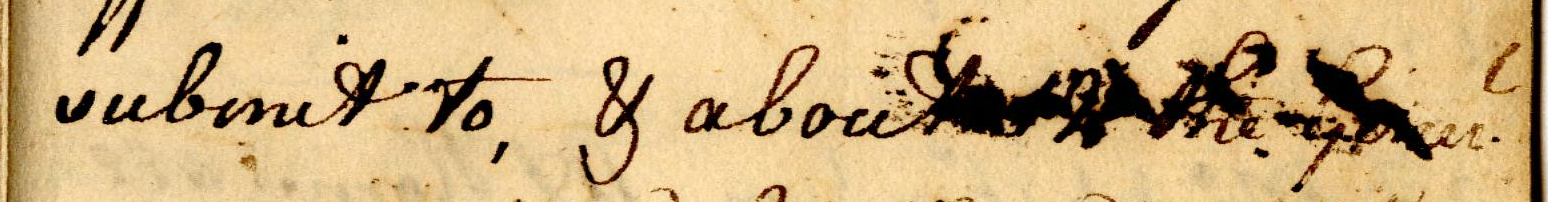submit to, & about [12 the Gener^l.]
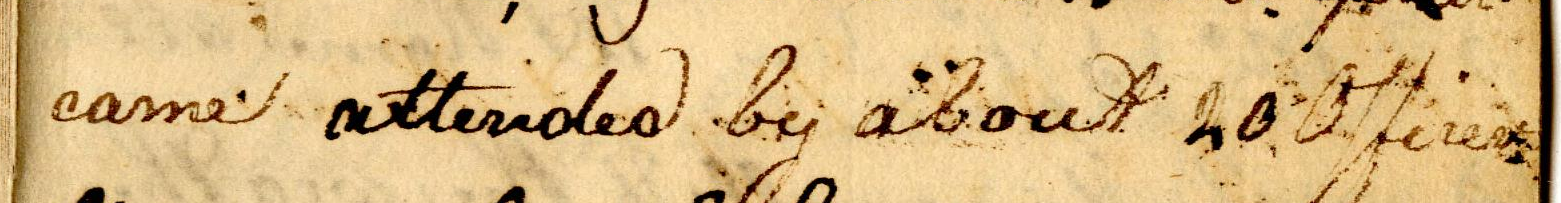came attended by about 40 Officers
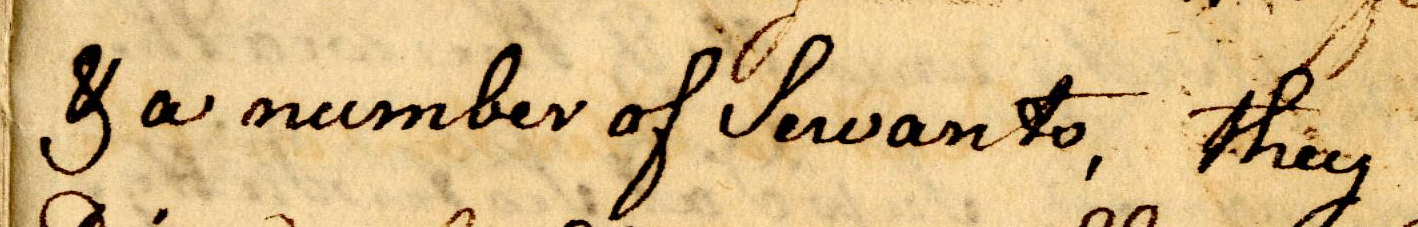& a number of Servants, they
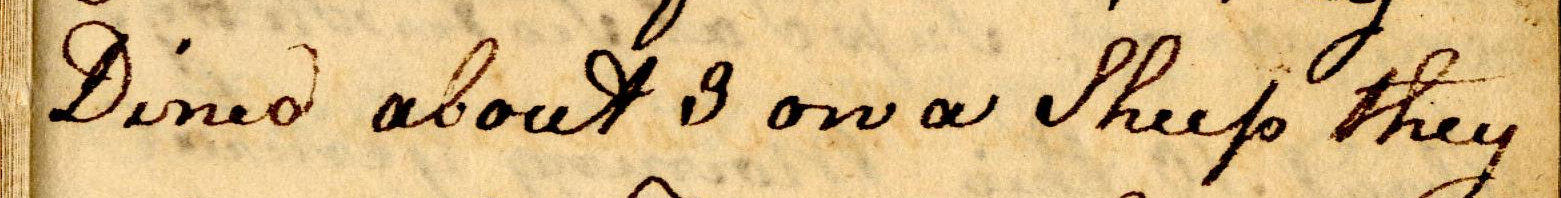Dined about 3 on a Sheep they
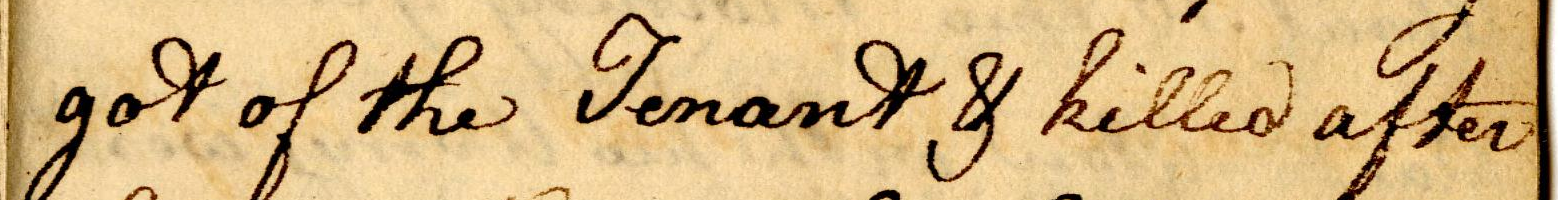got of the Tenant & killed after
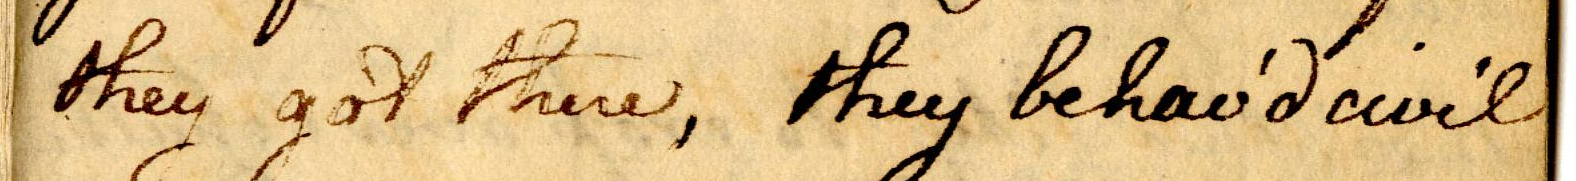they got there, they behav'd civil
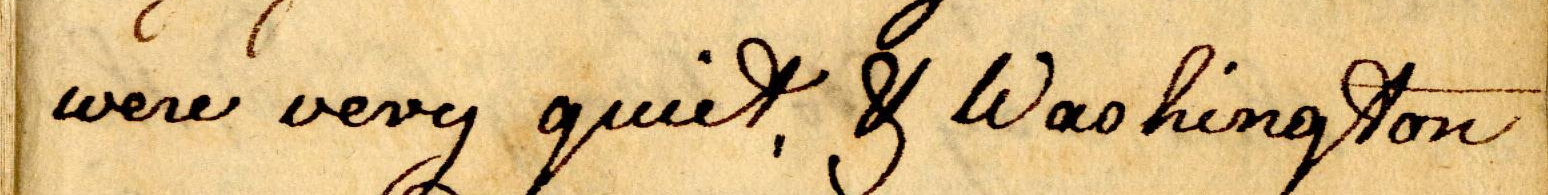were very quiet, & Washington
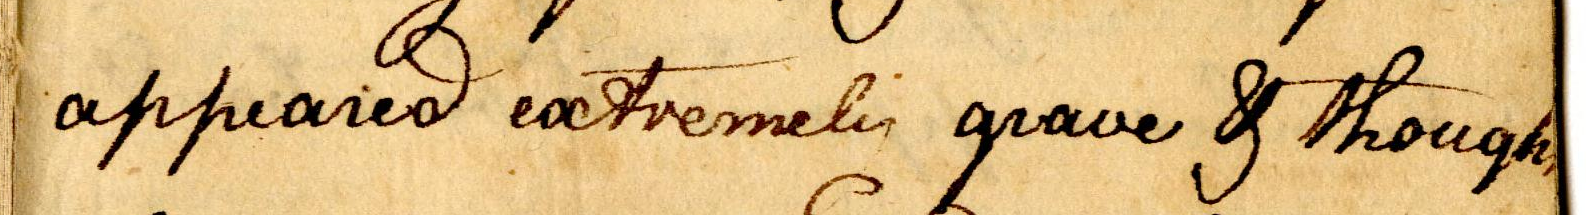appeared extremely grave & though
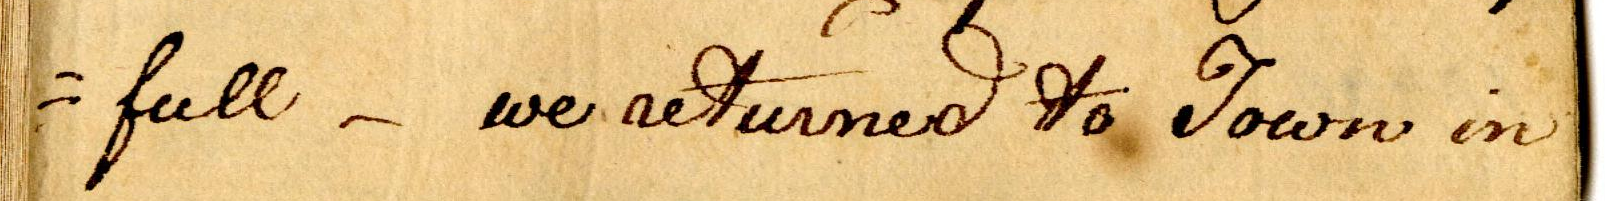-full- we returned to Town in
